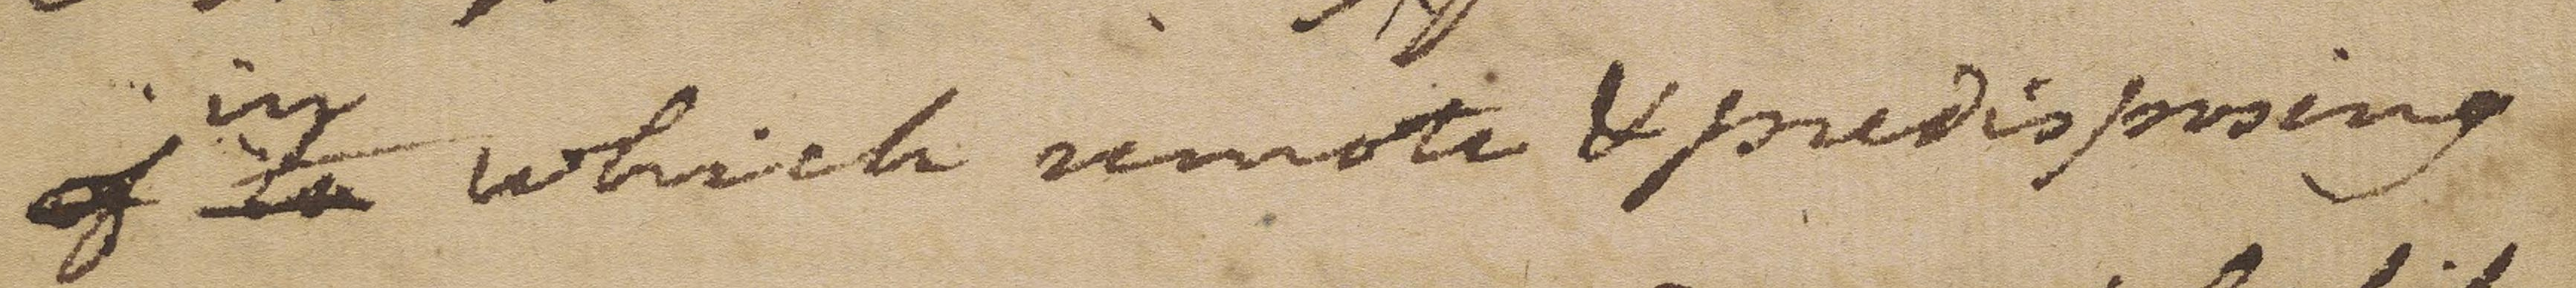of ^ which remote & predisposing
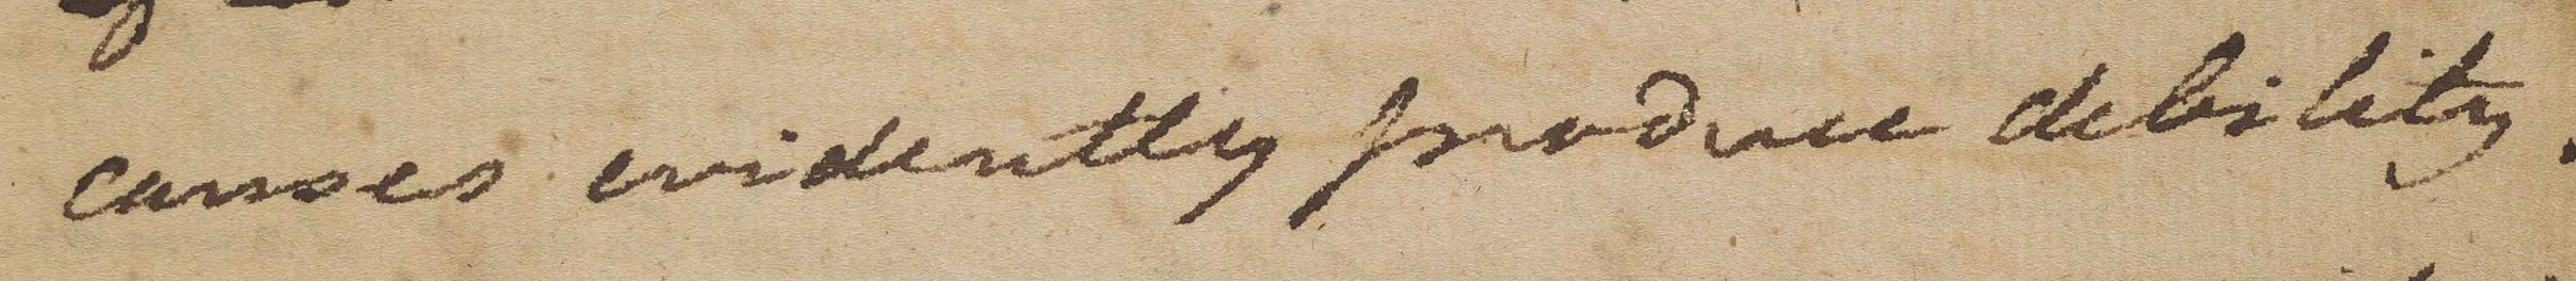causes evidently produce debility.
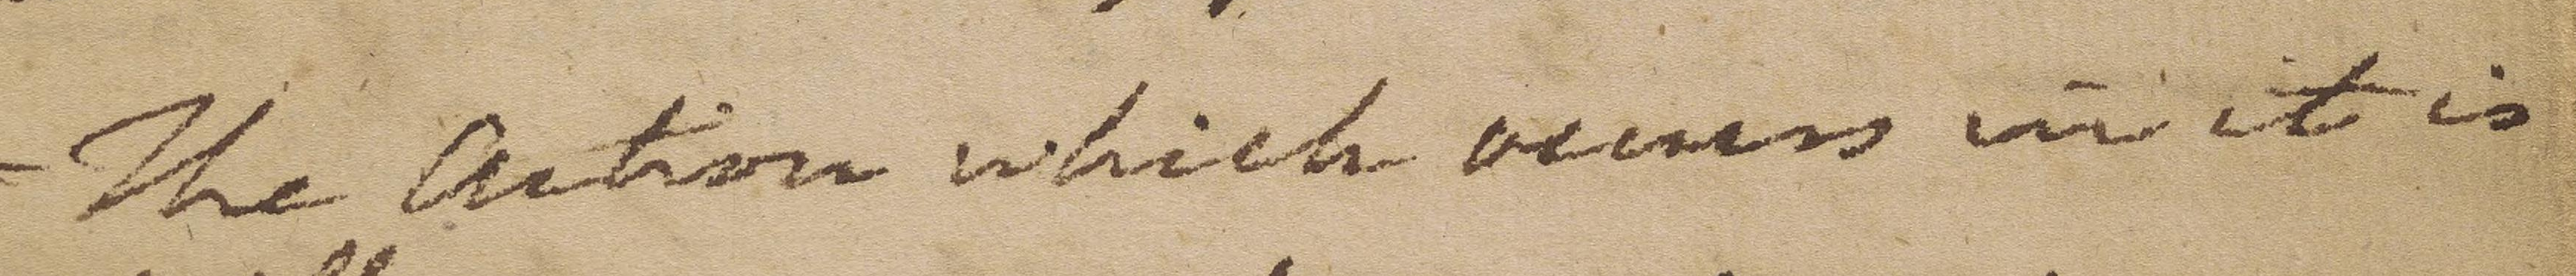The Action which occurs in it is
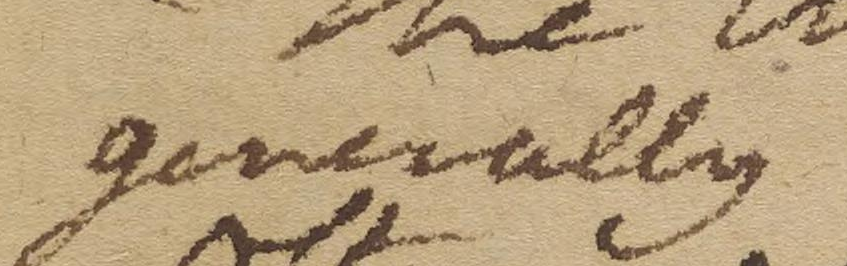generally
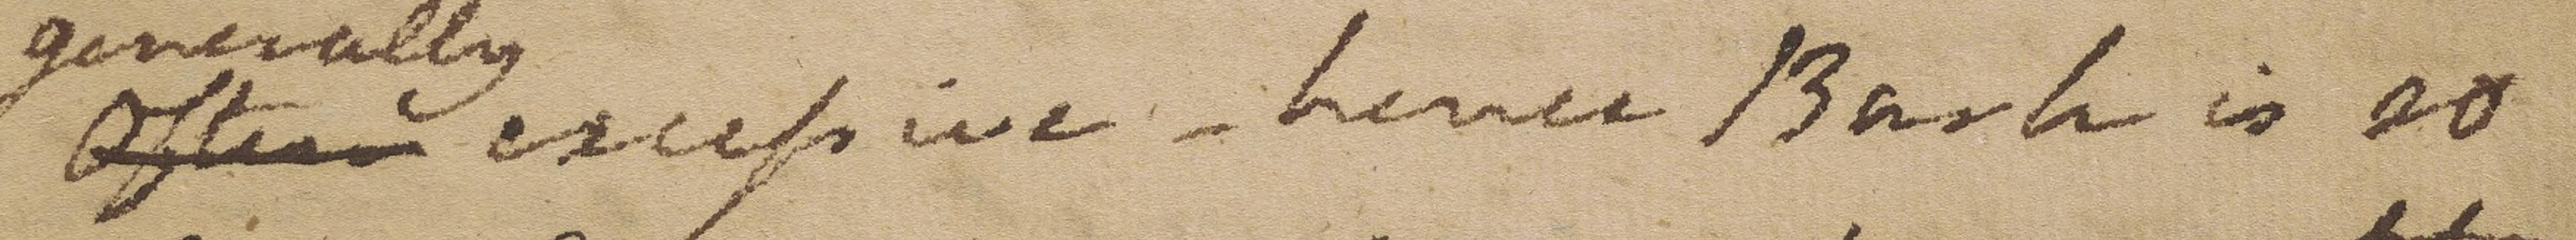[Often] excessive- hence Bark is so
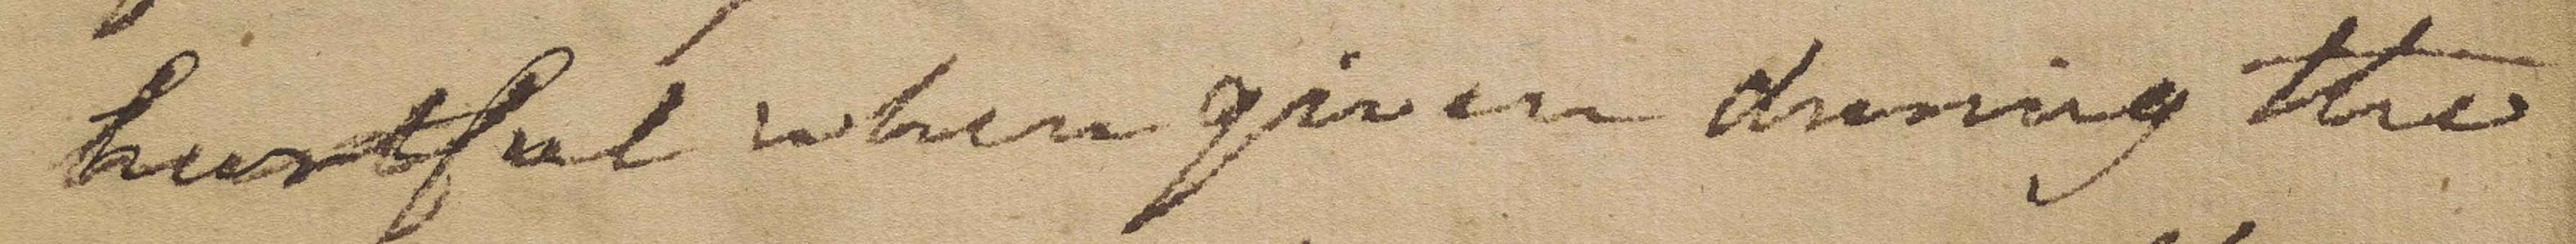hurtful when given during the
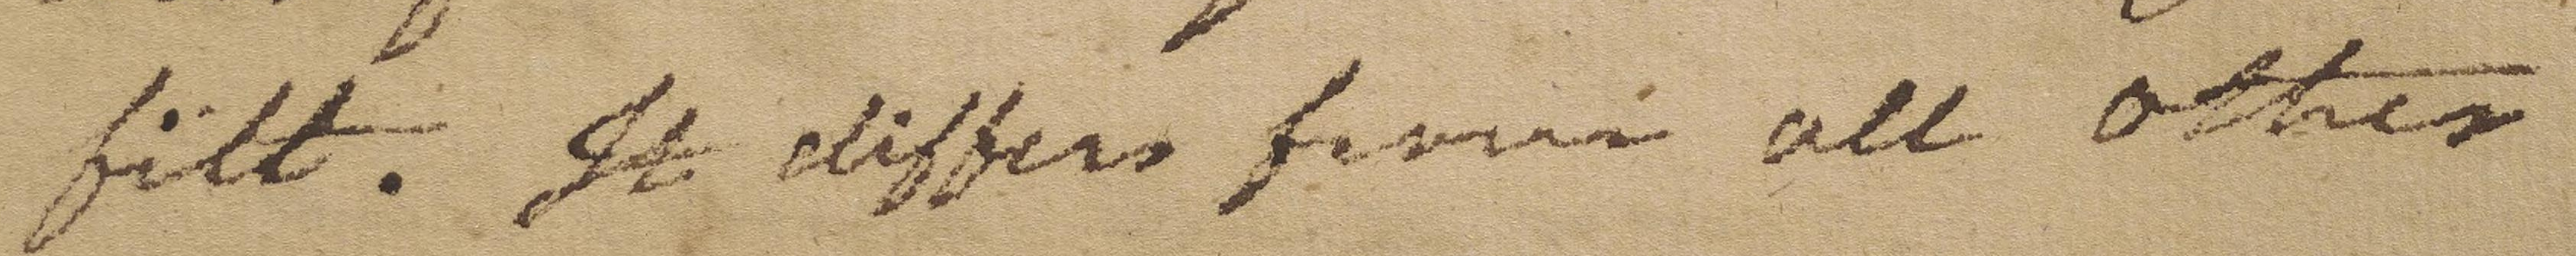fitt. It differs from all other
